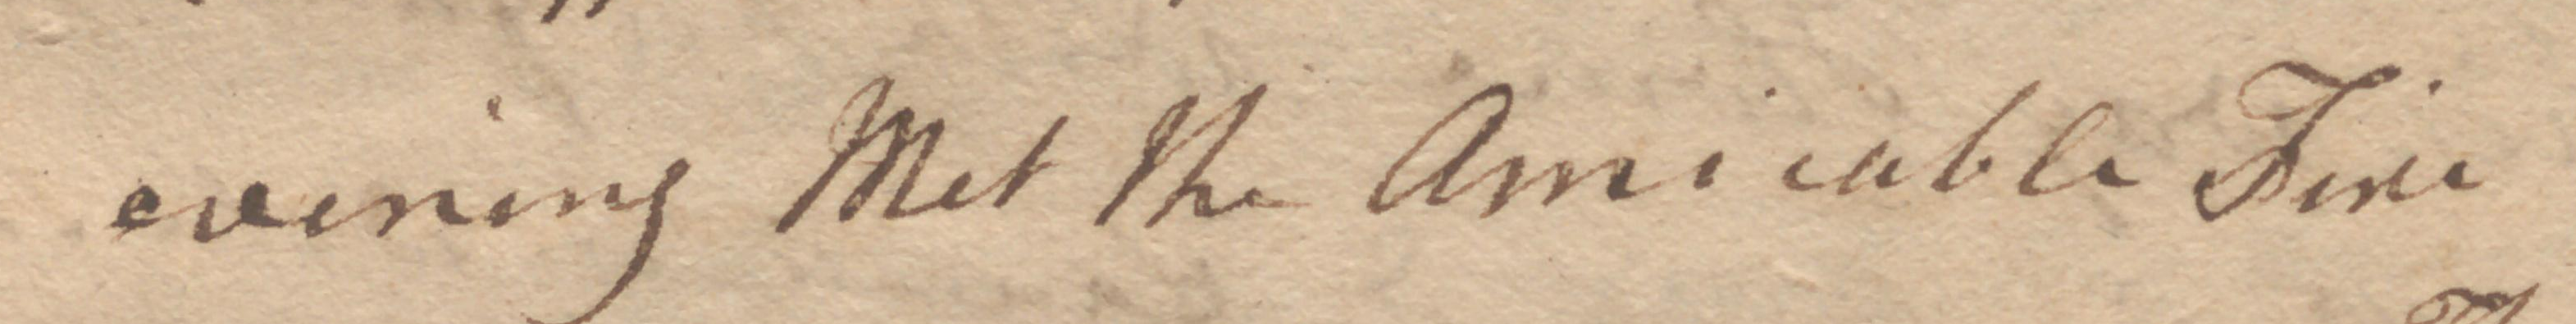evening Met the Amicable Fire
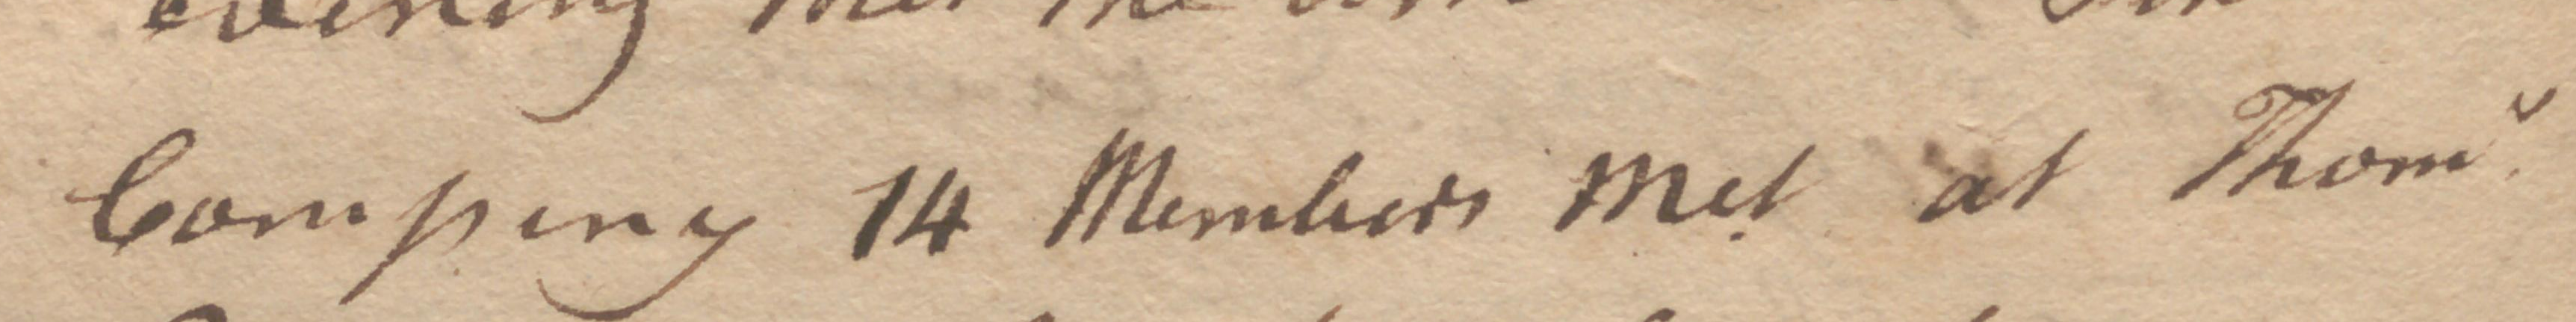Company 14 Members Met at Thom^s.
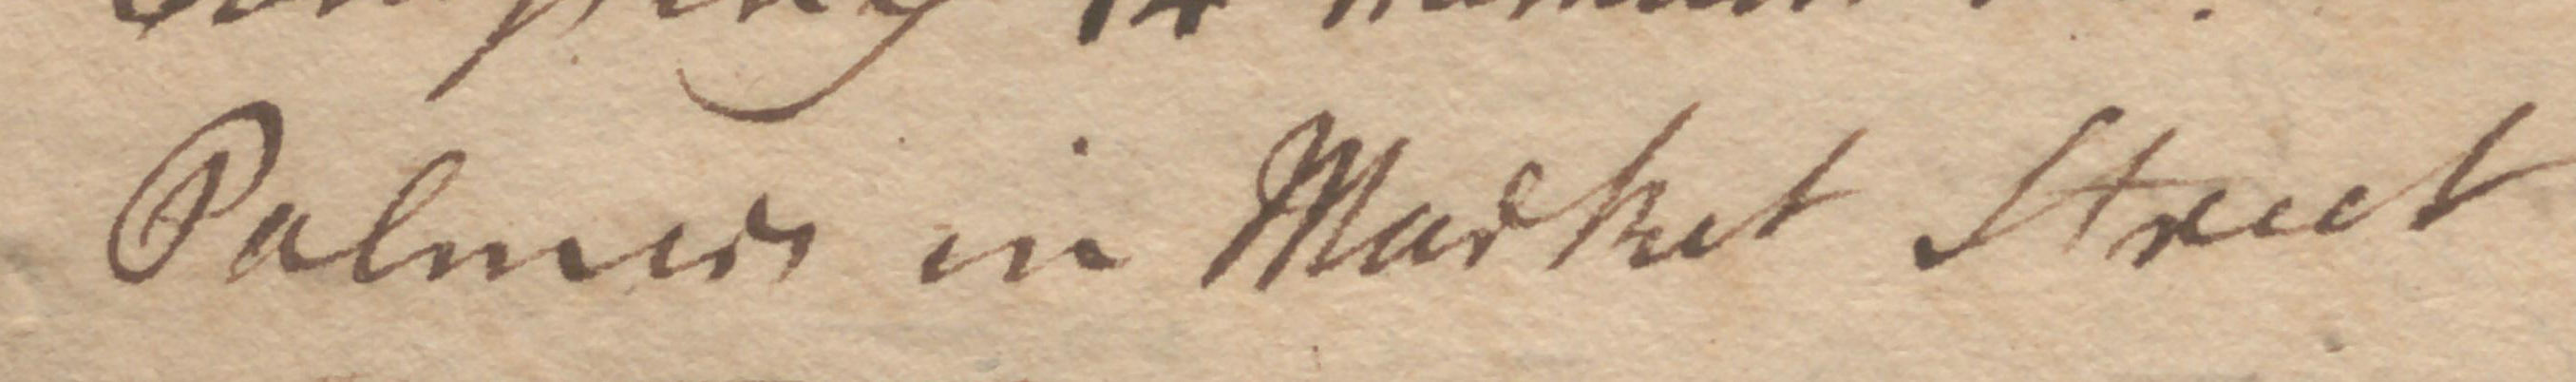Palmers in Market Street
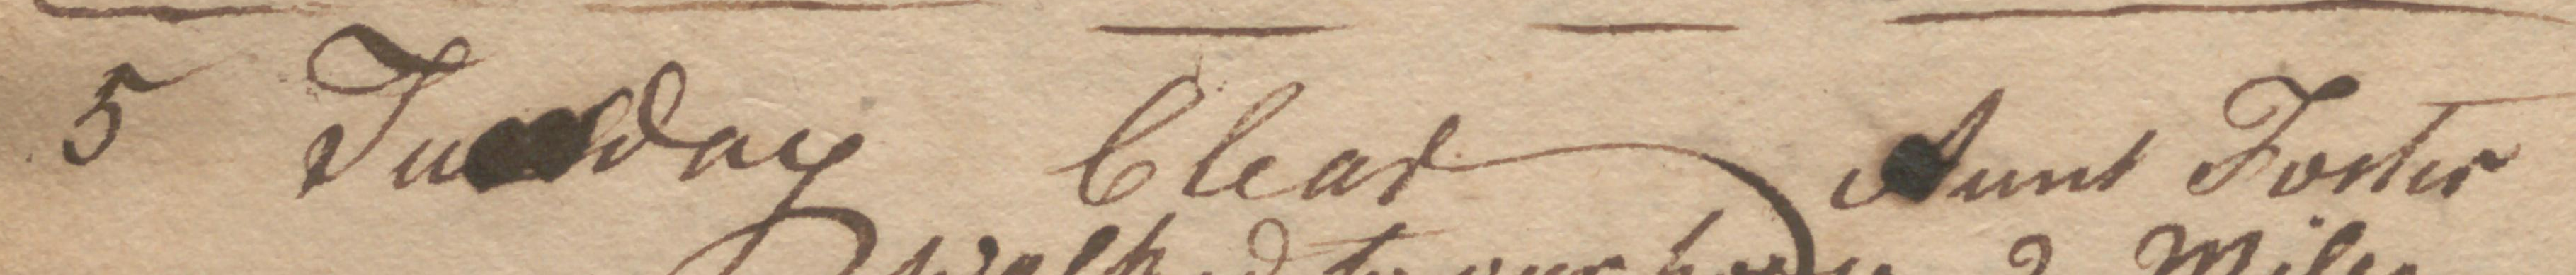5 Tuesday Clear Aunt Foster
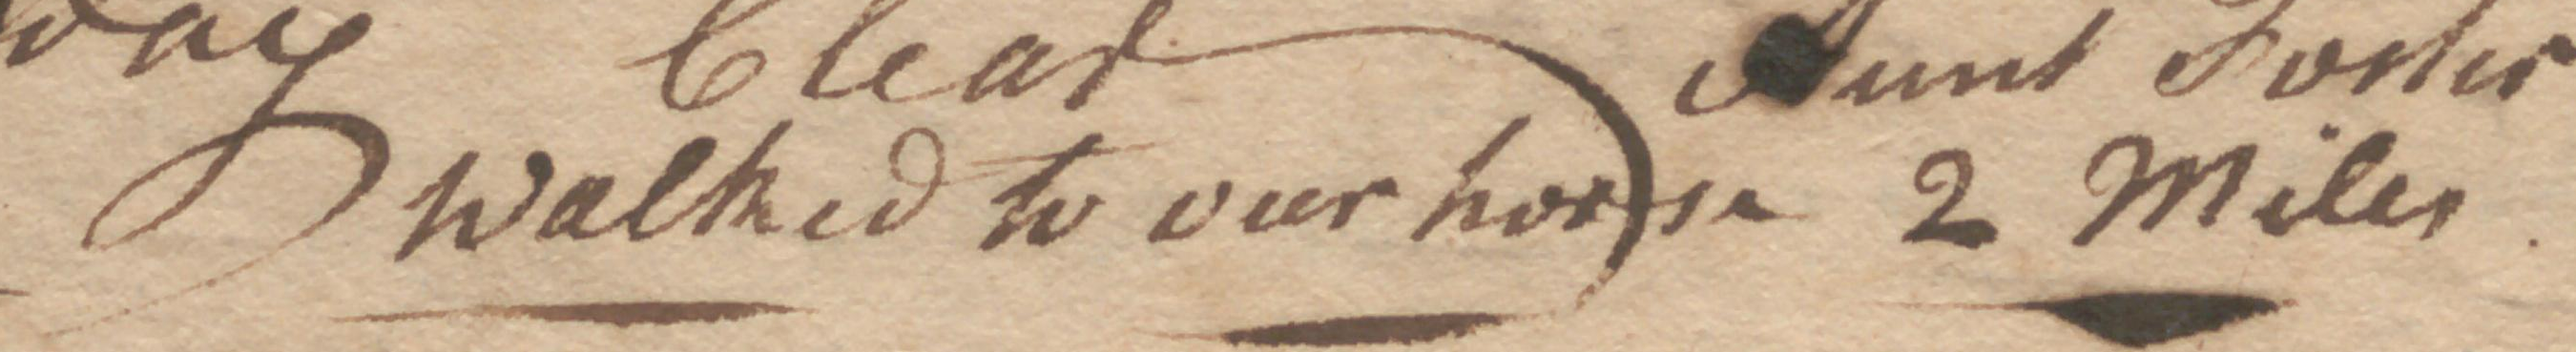walked to our house 2 Miles
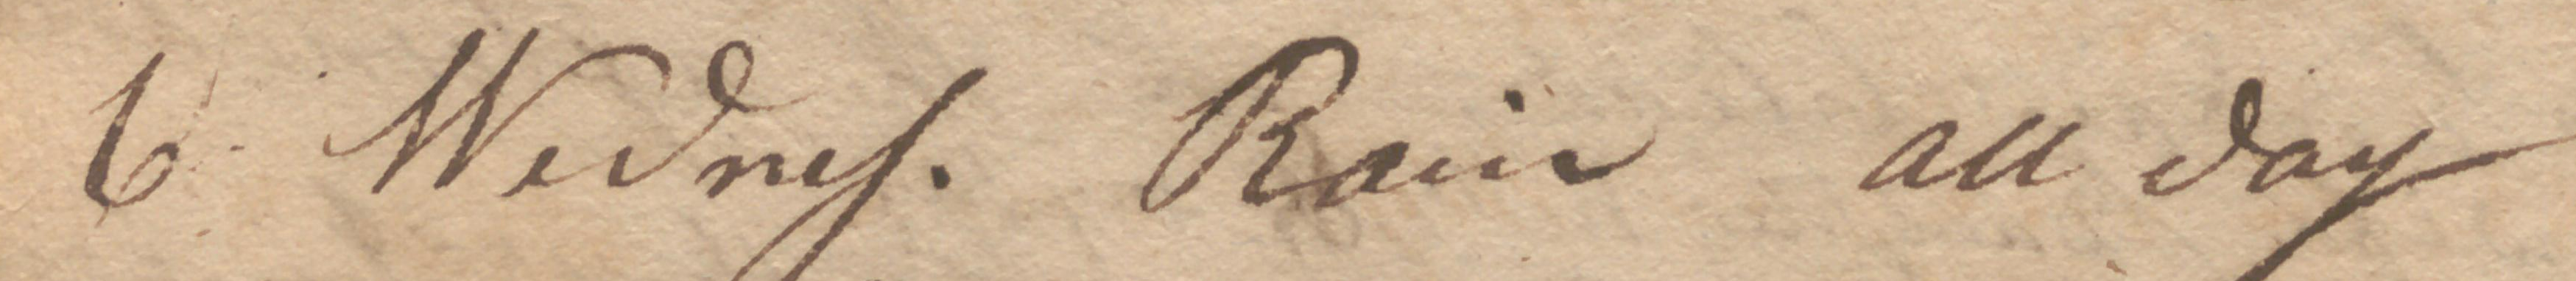6. Wednes. Rain all day
